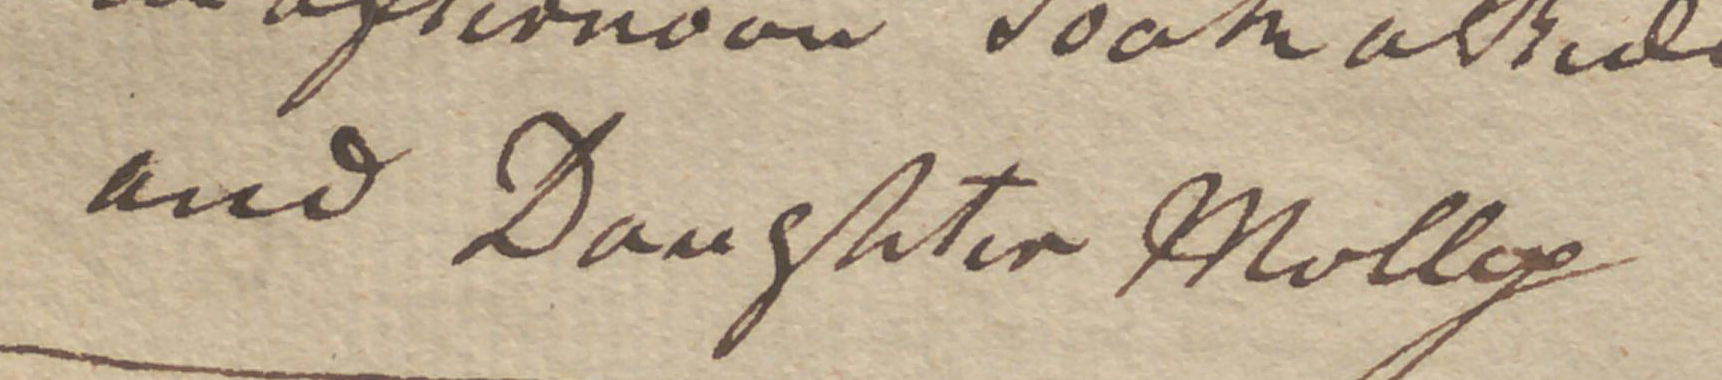aned Daughter Molly
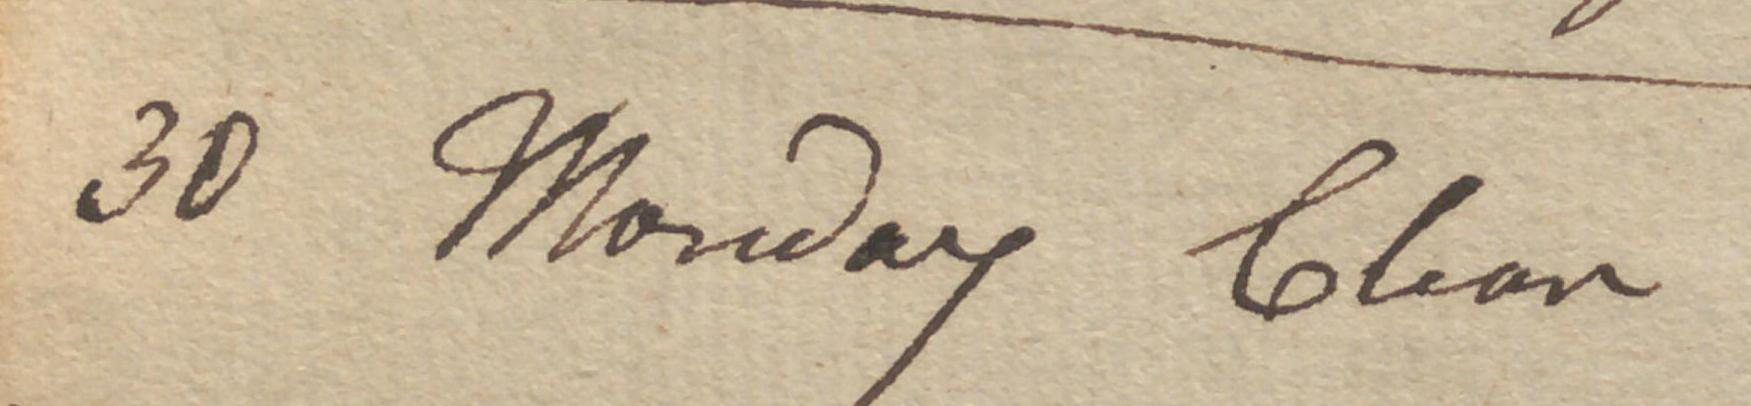30 Monday Clear
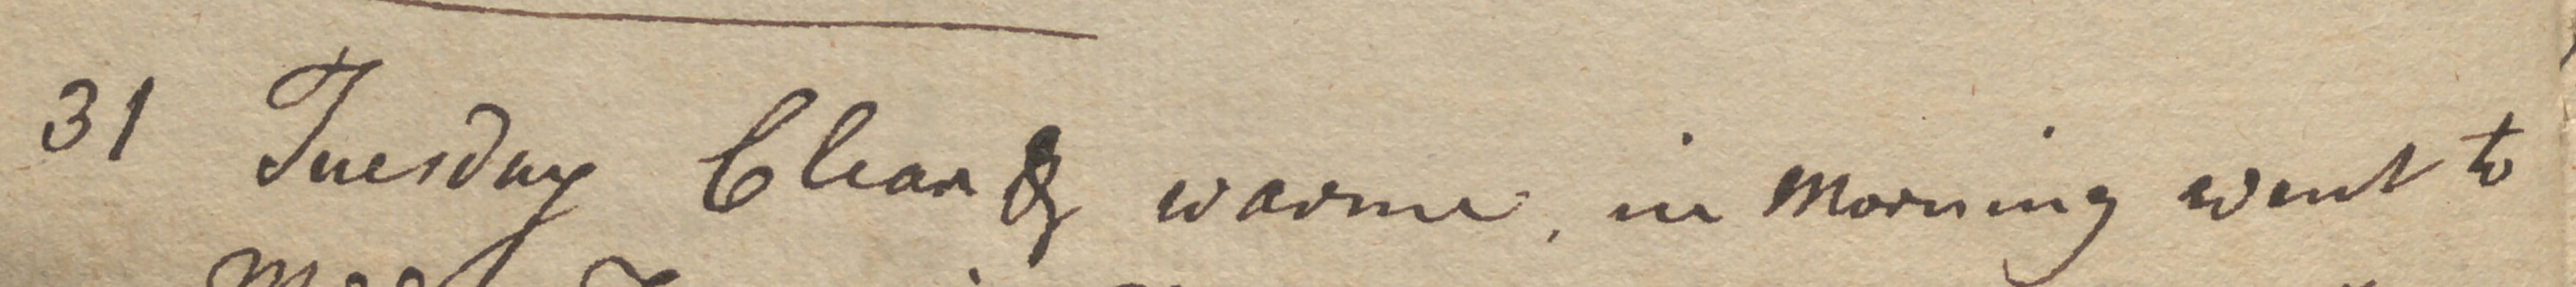31 Tuesday Clear & warme, in morning went to
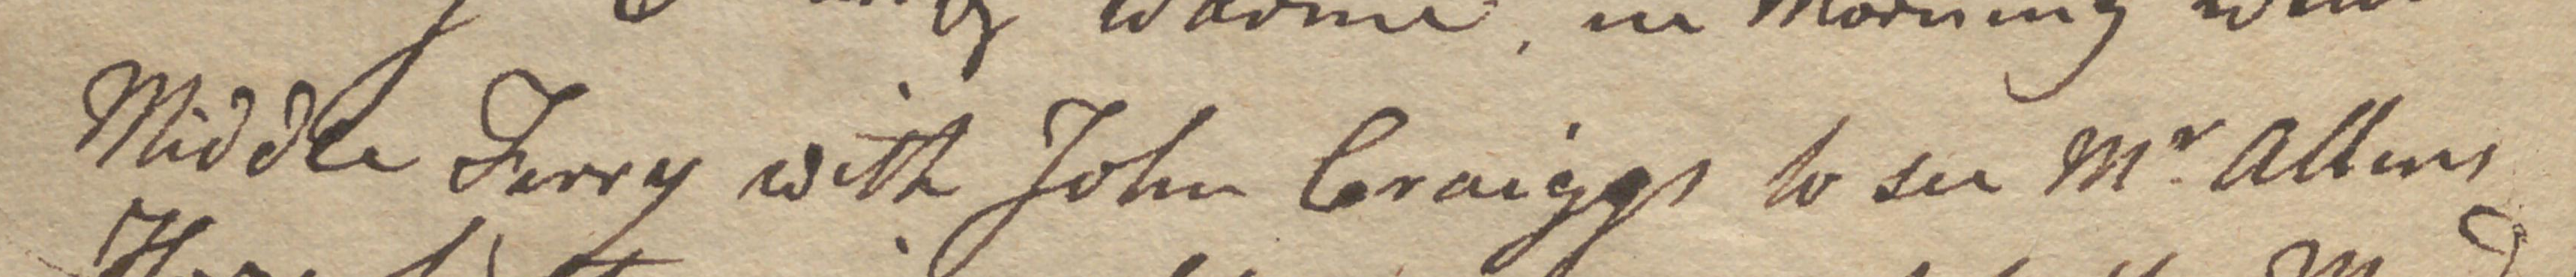Middle Ferry with John Craiggs to see M^r. Allens
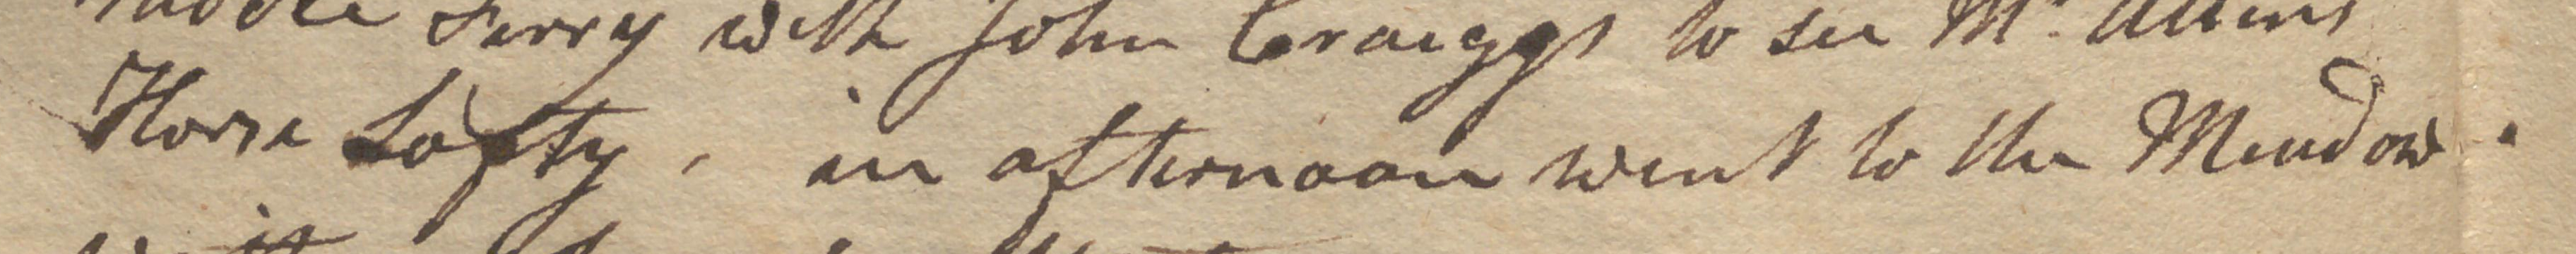Horse Lofty. in afternoon went to the Meadow.
